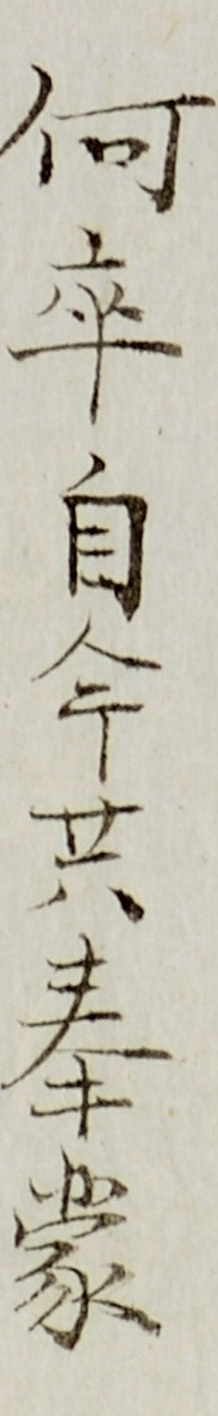何卒自今共奉蒙
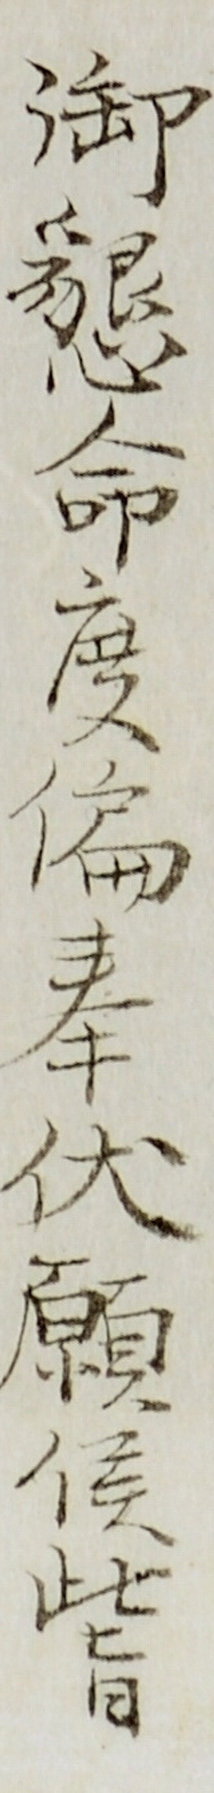御懇命度偏奉伏願候此旨
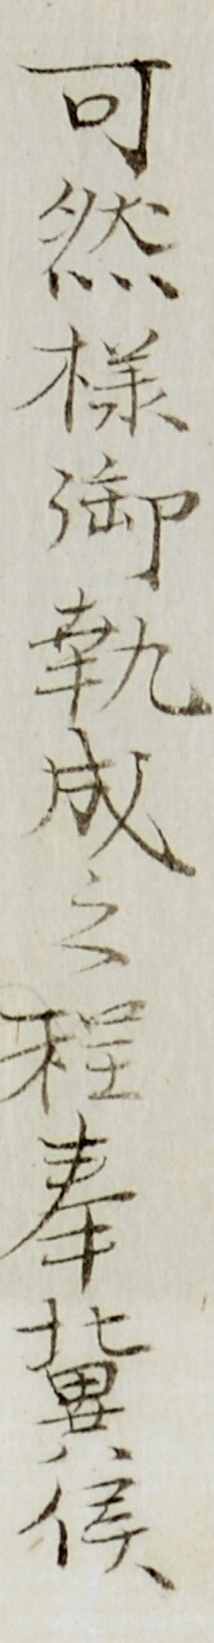可然様御執成之程奉冀候
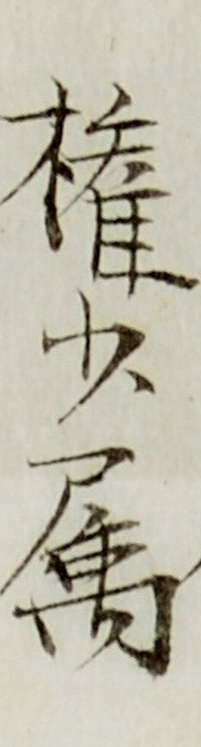権少属
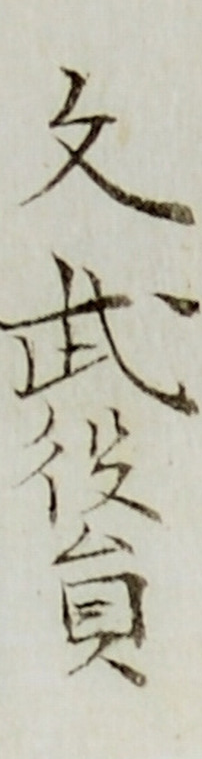文武役員

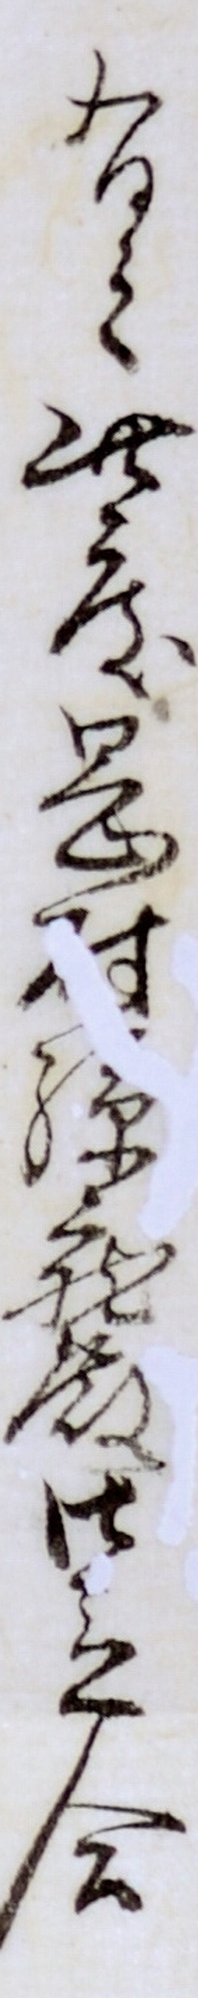有之此度岡村孫蔵殿御立合
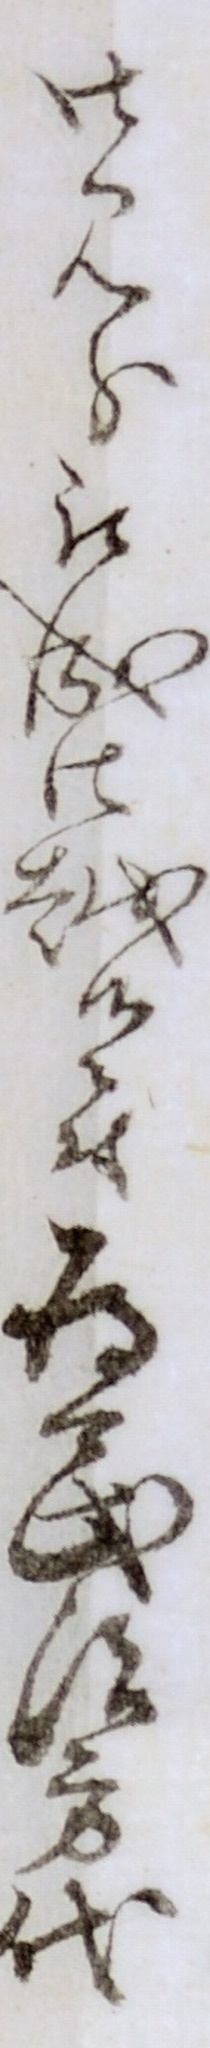御見分被成御越候に付為民治方代
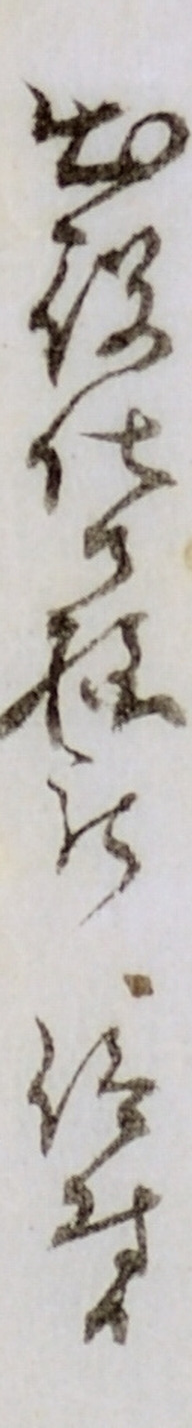出役仕候様被仰付候
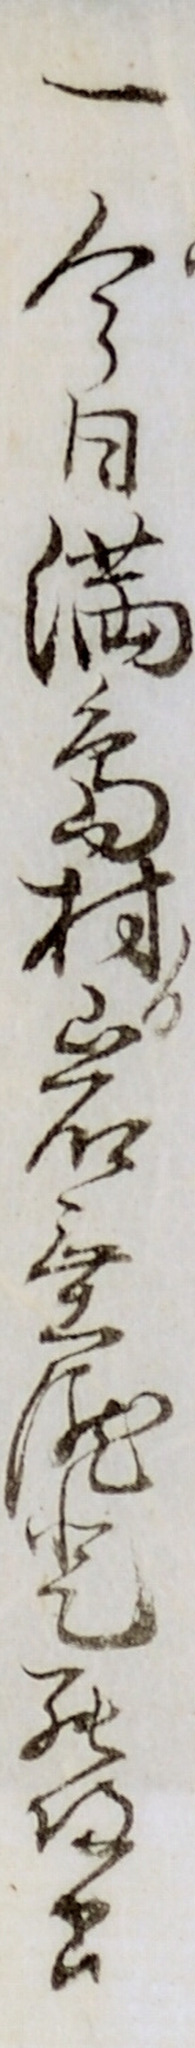一今日満島村ゟ岩垂滝登罷帰申候
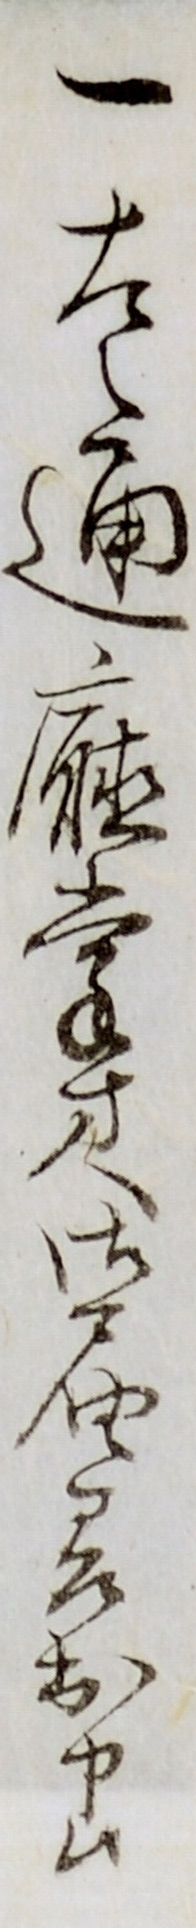一左之通庁掌方へ御届差出申候
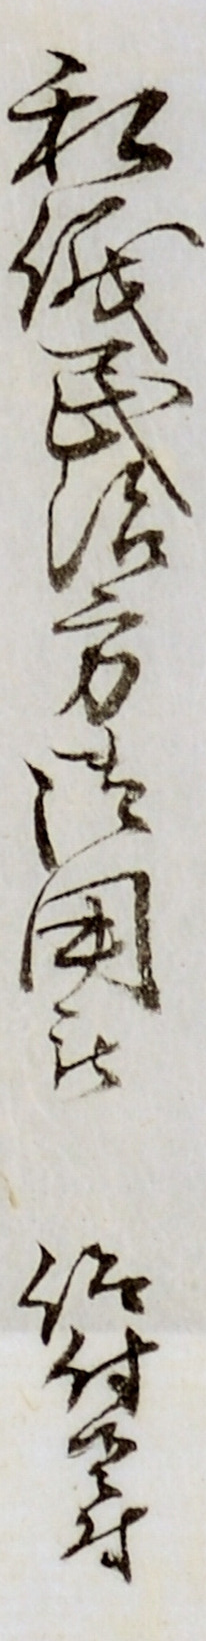私儀民治方御用被仰付候に付
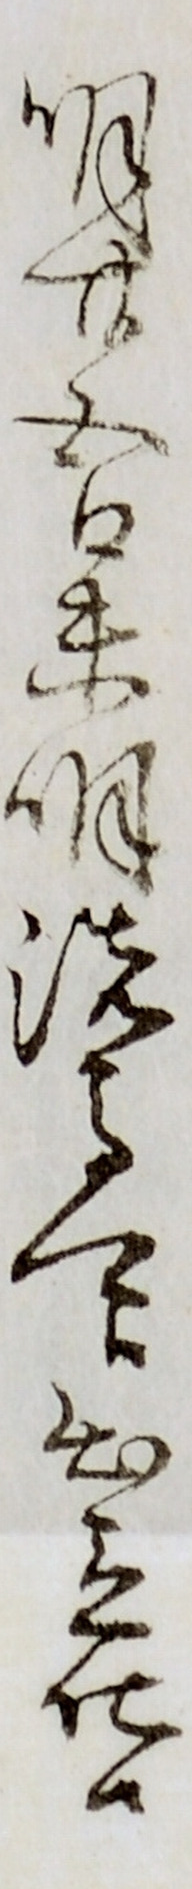明廿五日未明洗馬郷え出立仕候
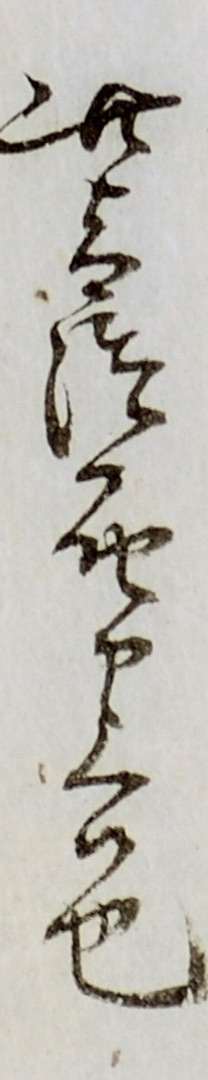此旨御届申上候也
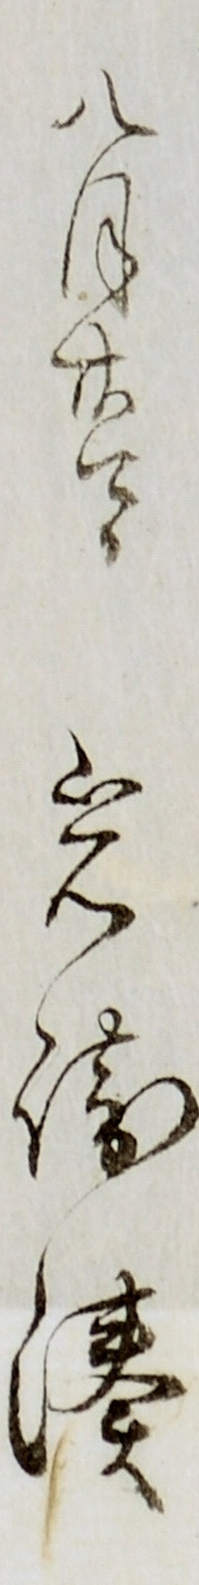八月廿四日岩崎湊
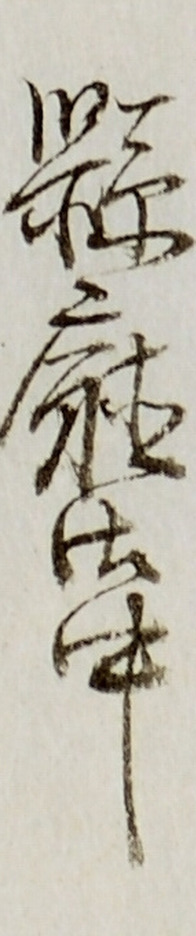県庁御中
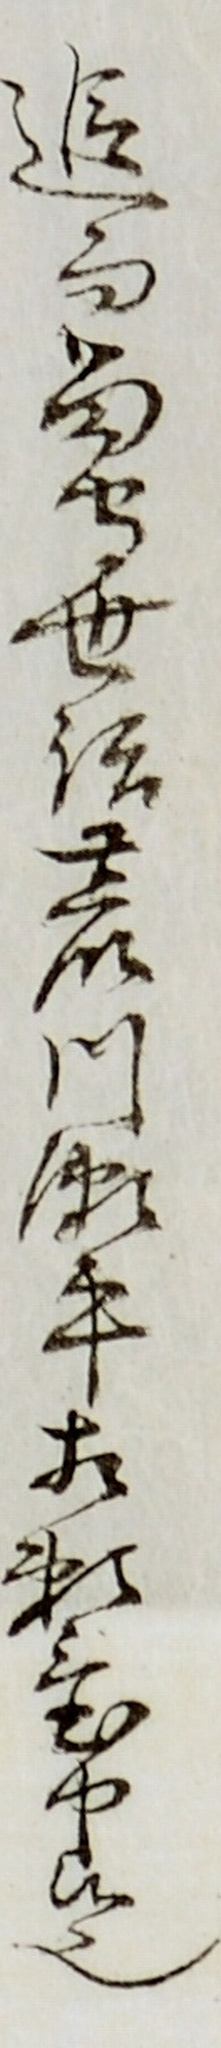追て留守世話荒川瀬平相頼置申候也
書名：山林方諸事御用留
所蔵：伊那市立高遠町図書館・合同会社AMANE
